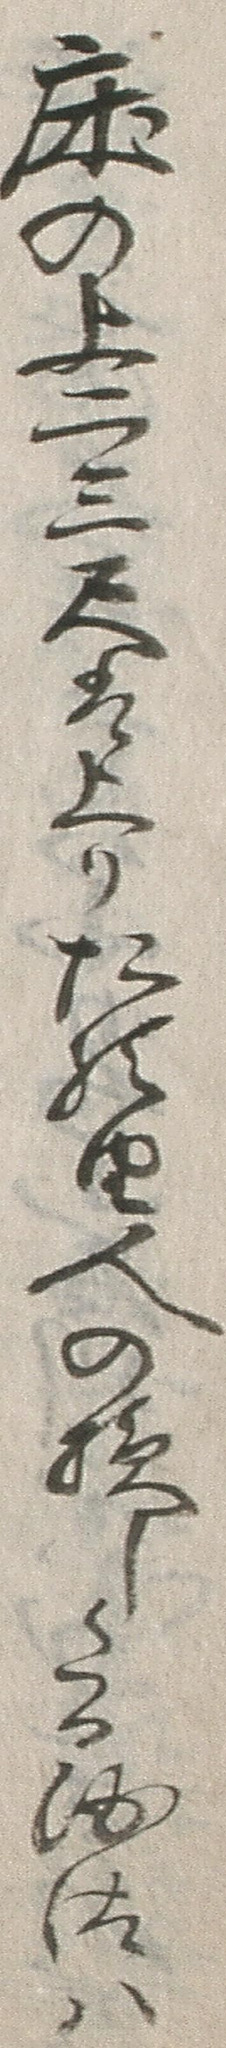床の上二三尺は上りたる由人の損したる沙汰は
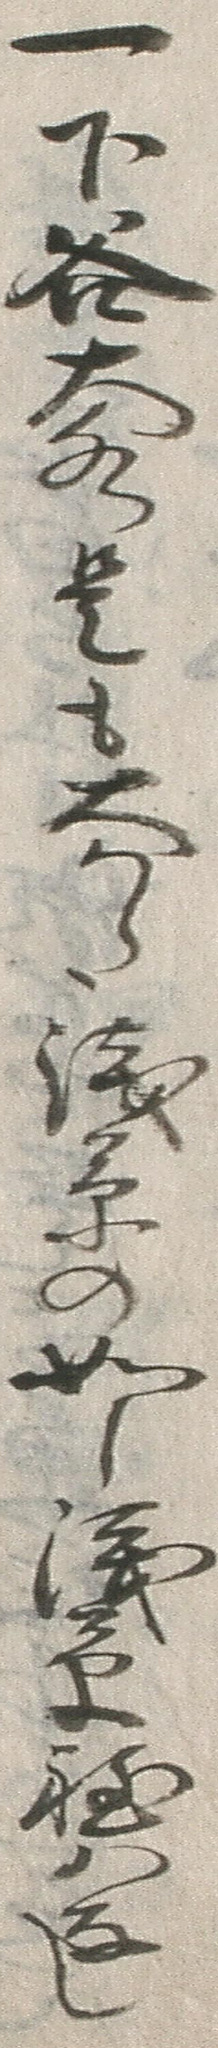一下谷大水是も大かた浅草の如し浅草程はなし
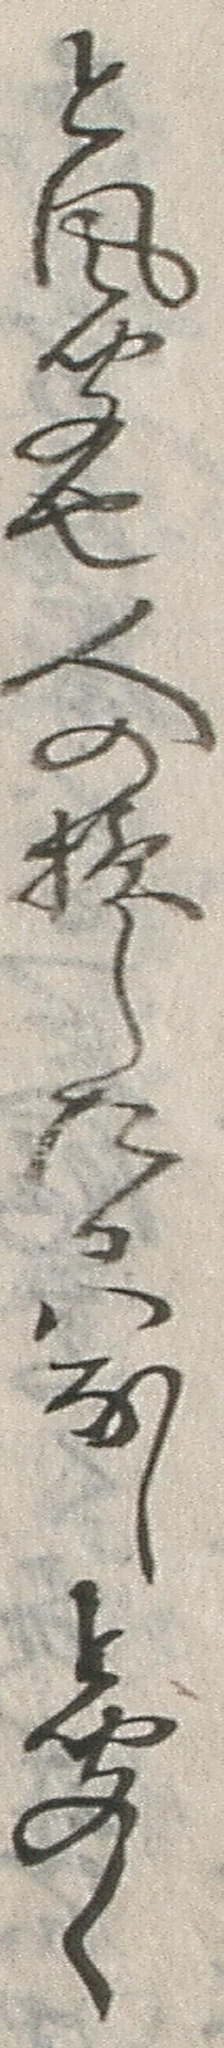と風聞也人の損したるはなしと聞く
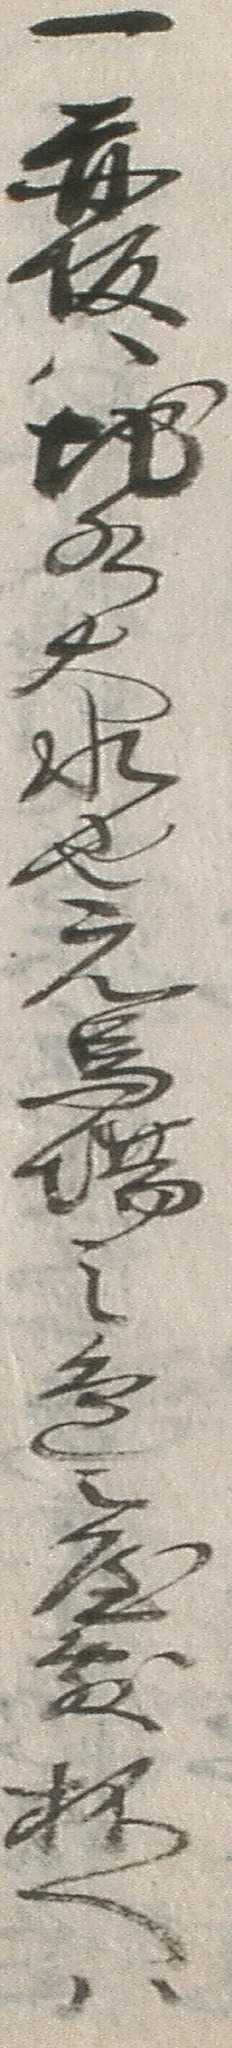一赤坂は地水大水也元馬場之辺之屋敷抔へは
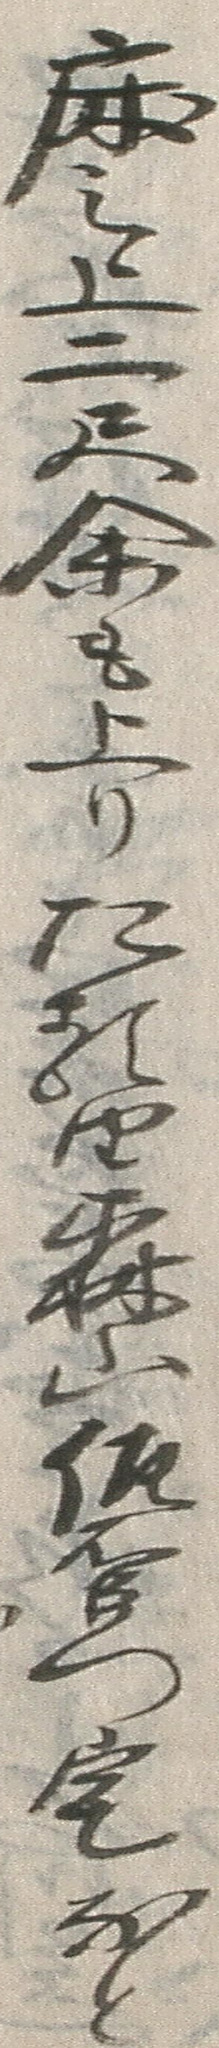床之上二尺余も上りたる由森山佐右衛門宅なと
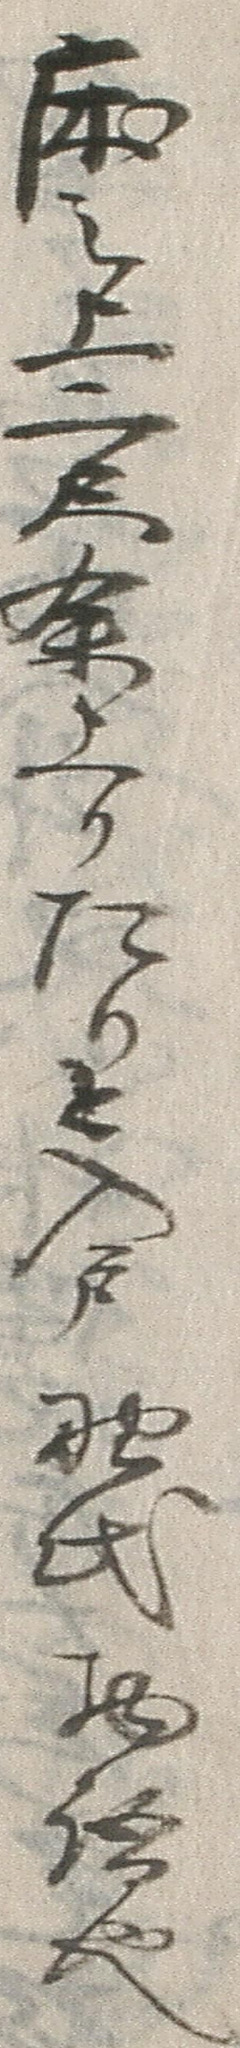床之上二尺余上りたりと入戸野氏物語也
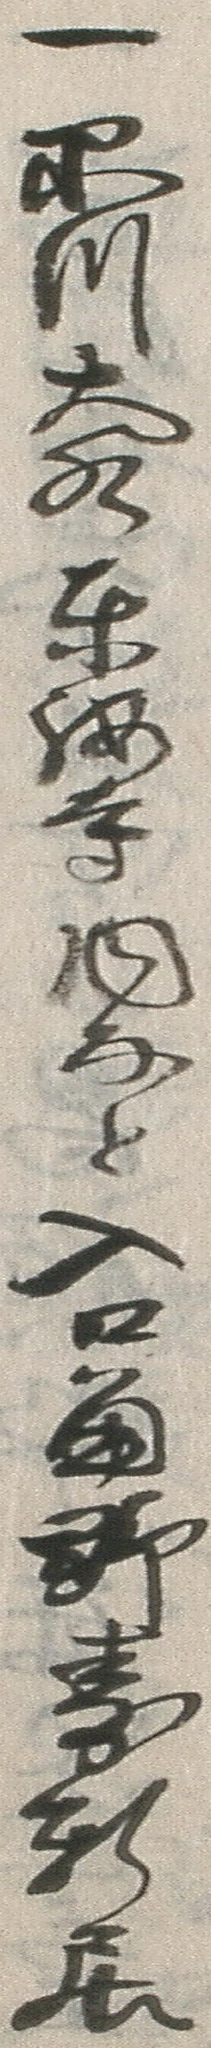一品川大水東海寺内なと入口角野寿軒居
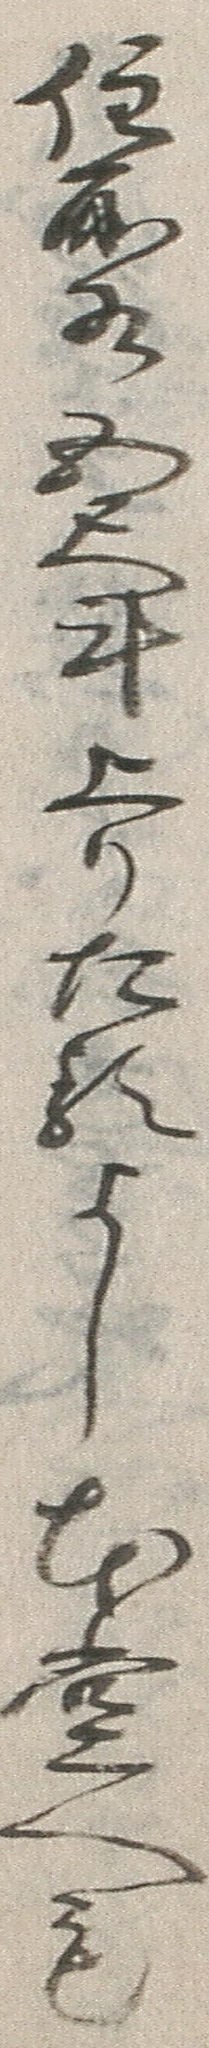住所水五尺計上りたるよし本堂へも
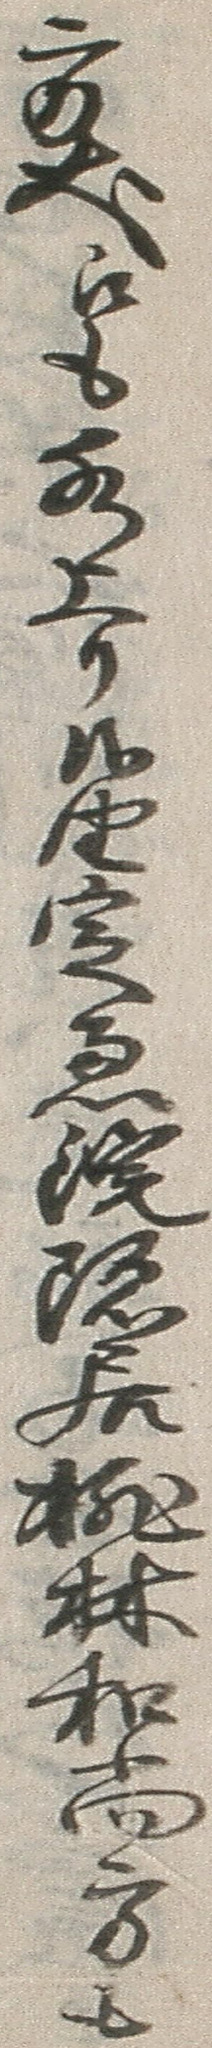方丈えも水上り候由定恵院隠居桃林和尚方も
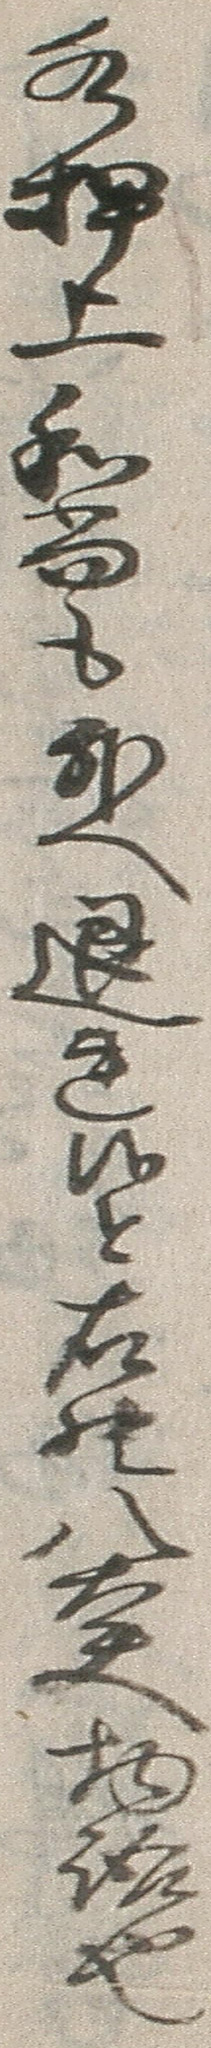水押上和尚も外へ退き候と右の八大夫物語也
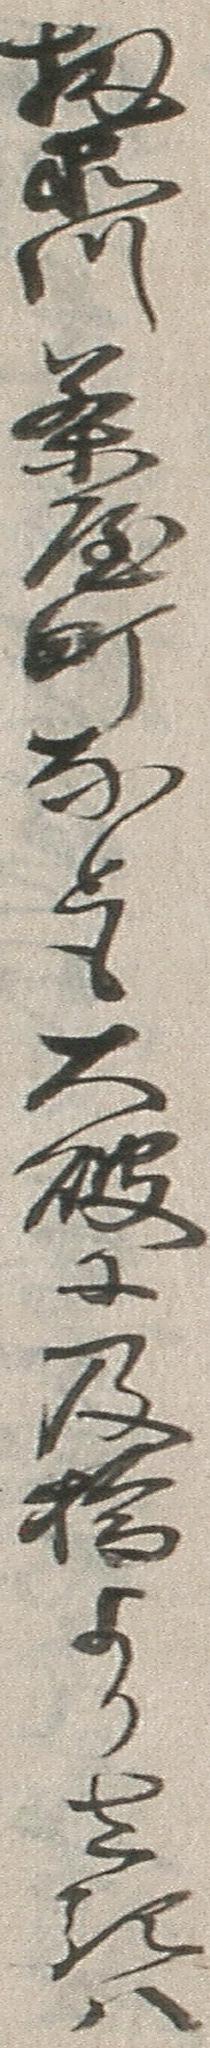扨品川茶屋町なとも大破に及橋よりさきは
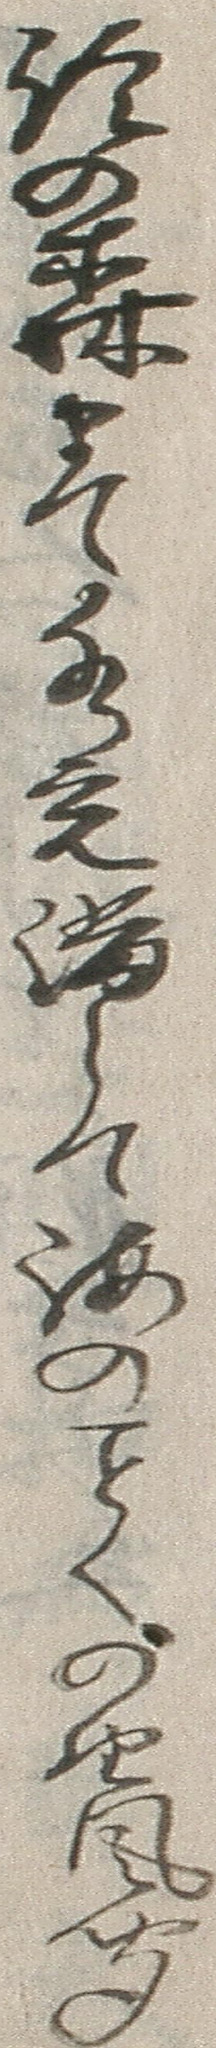跡の森まて水充満して海のことくの由風聞
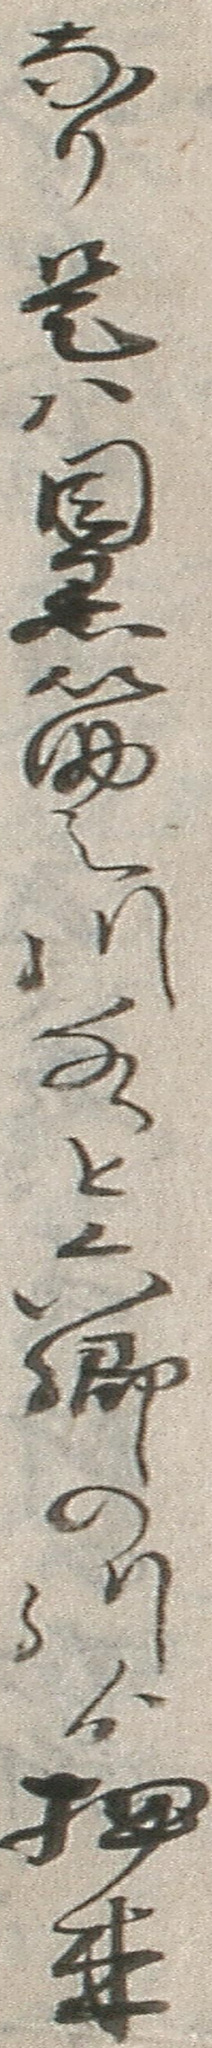なり是は目黒筋之川水と六郷の川ゟ押来
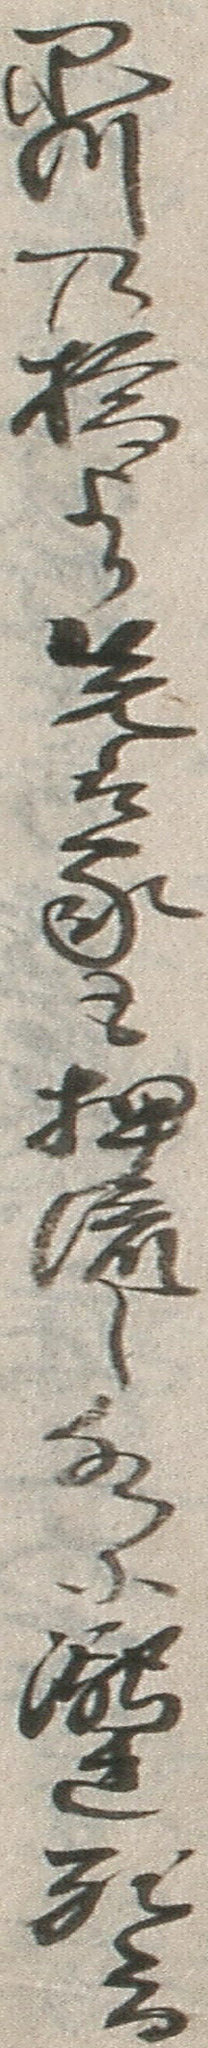品川の橋より先は家も押流し水に溺れ死たる
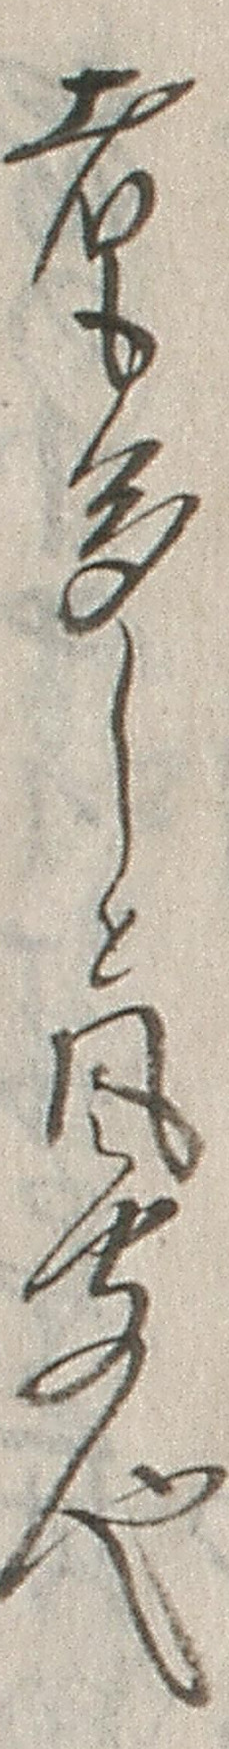者も多しと風聞也
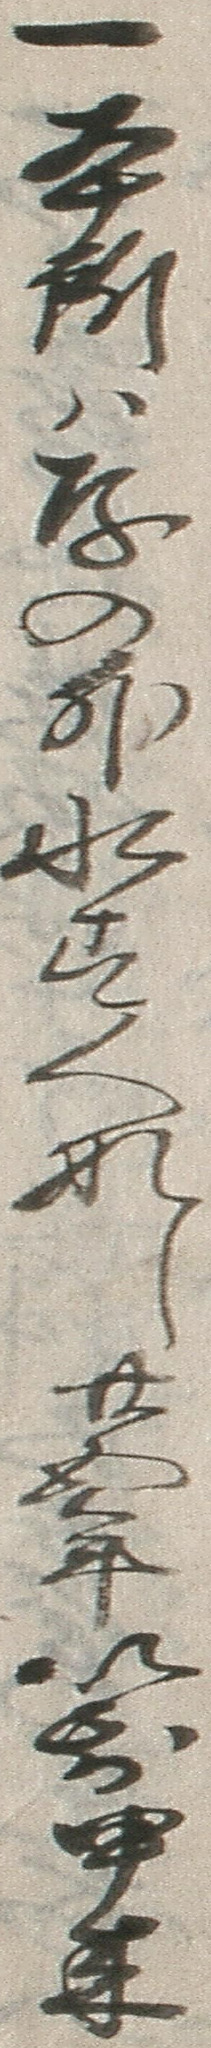一本所は存の外水すくなし廿五年以前申来
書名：享保十三年江戸洪水記
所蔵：東京大学地震研究所図書室 Earthquake Research Institute Library, The University of Tokyo, JAPAN
